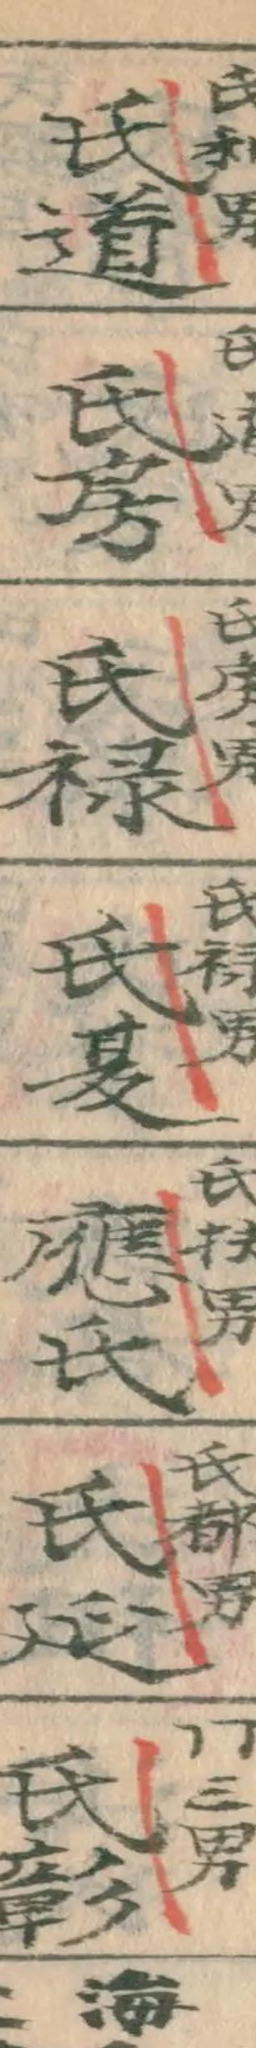氏道氏房氏禄氏夏応氏氏延氏彰泰氏
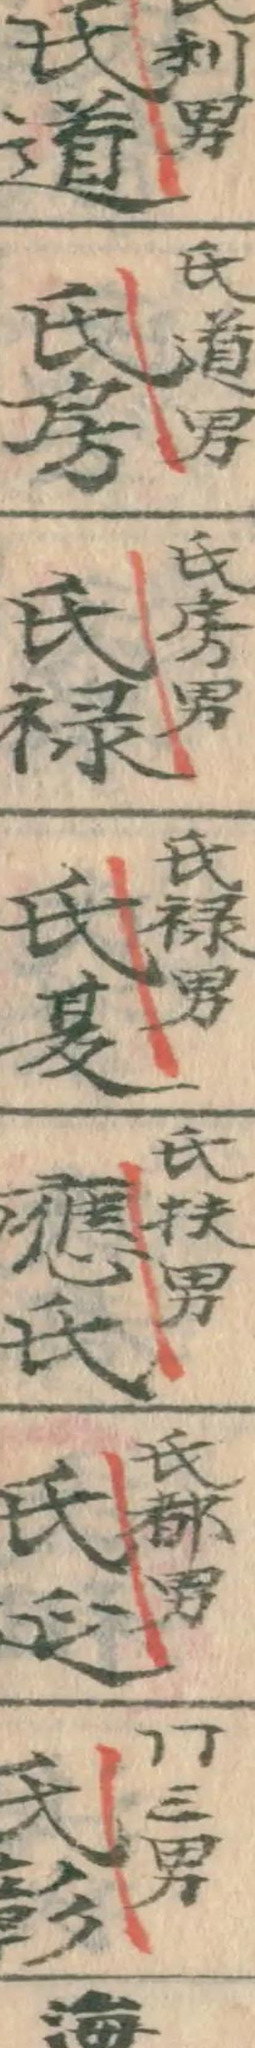氏道氏房氏禄氏夏応氏氏延氏彰泰氏

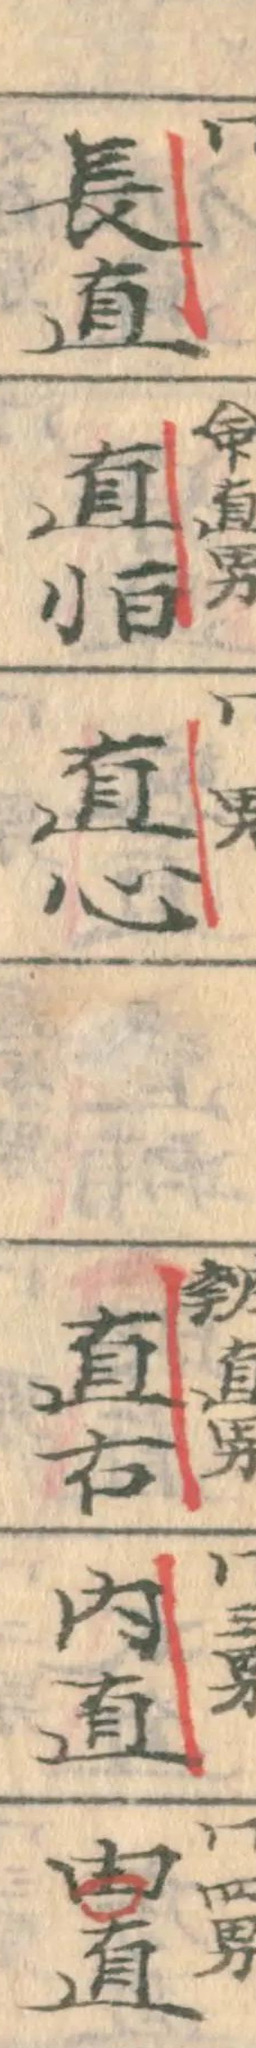長直直怕直心直右内直由直
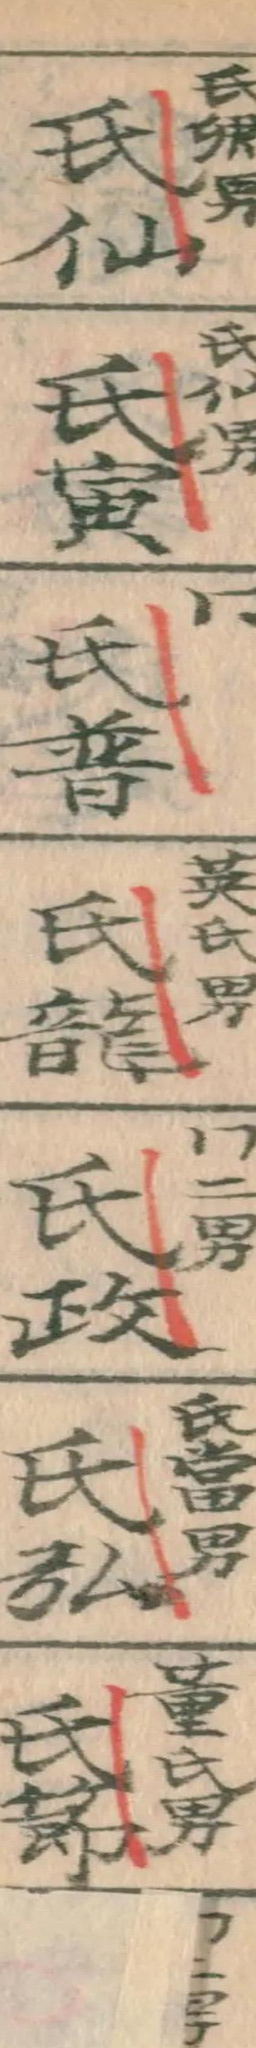氏仙氏寅氏普氏龍氏政氏弘氏節
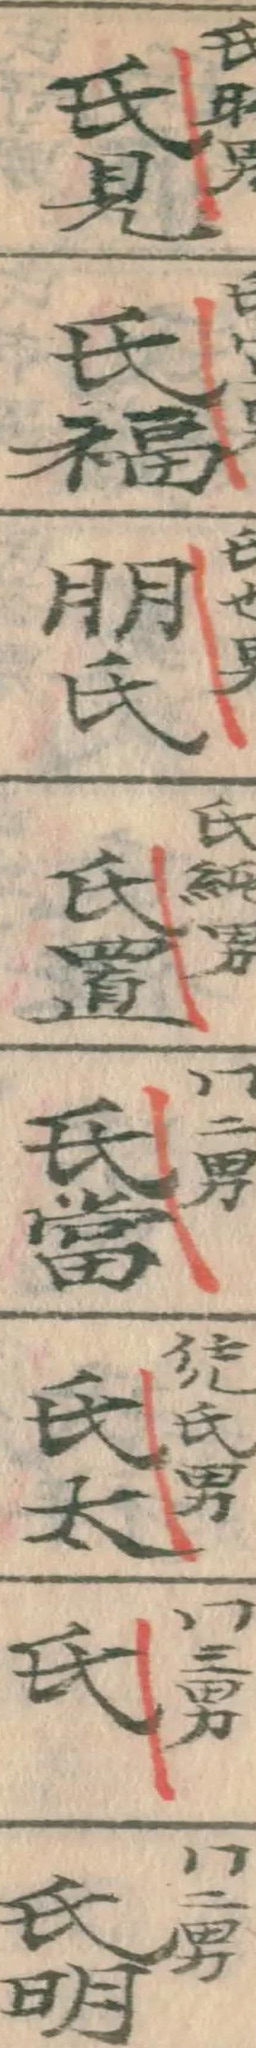氏見氏福朋氏氏置氏当氏太氏氏明
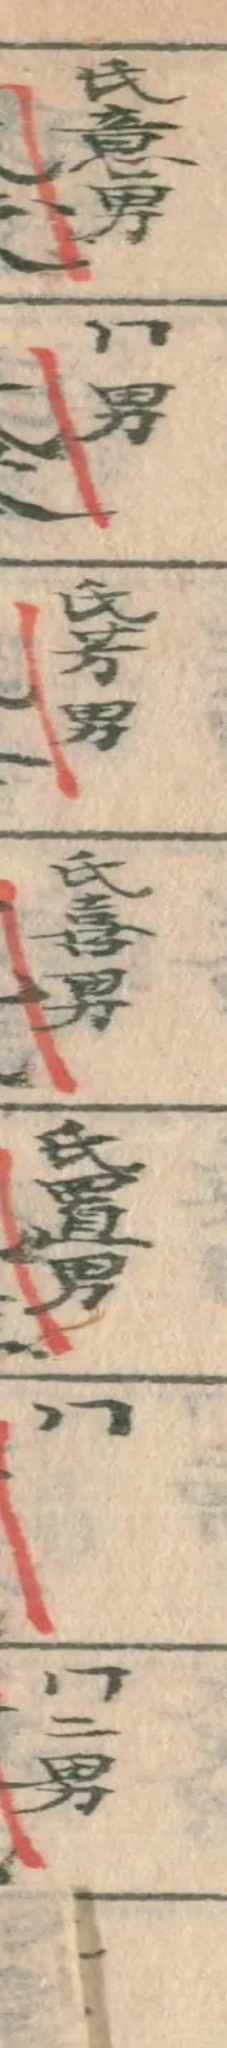氏意男同男氏芳男氏喜男氏置男同同二男
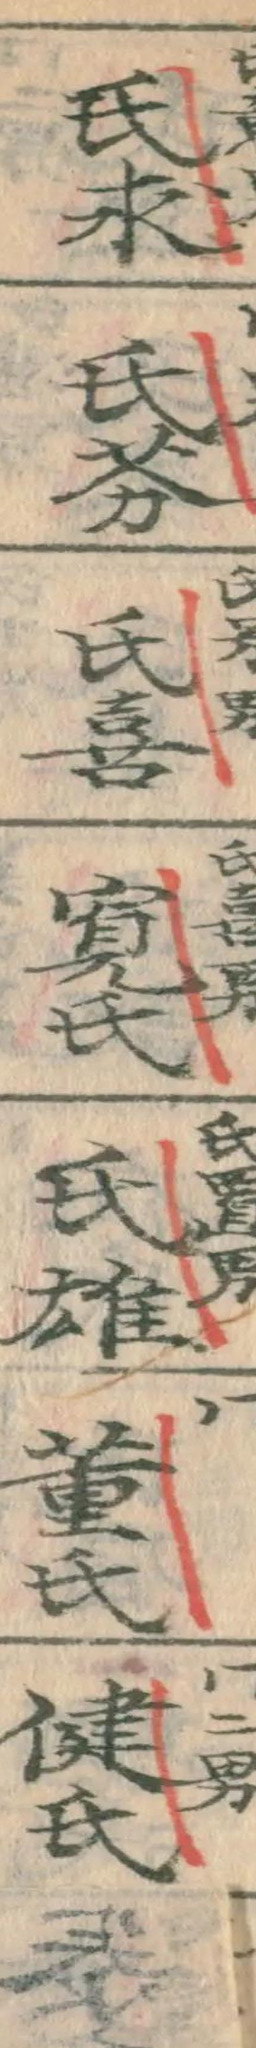氏求氏芬氏喜寊氏氏雄董氏健氏
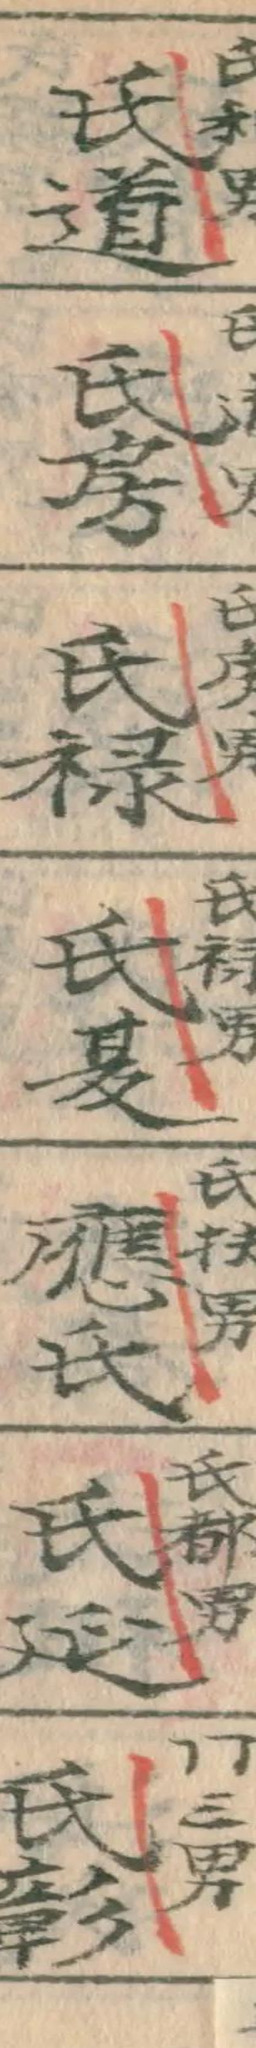氏道氏房氏禄氏夏応氏氏延氏彰

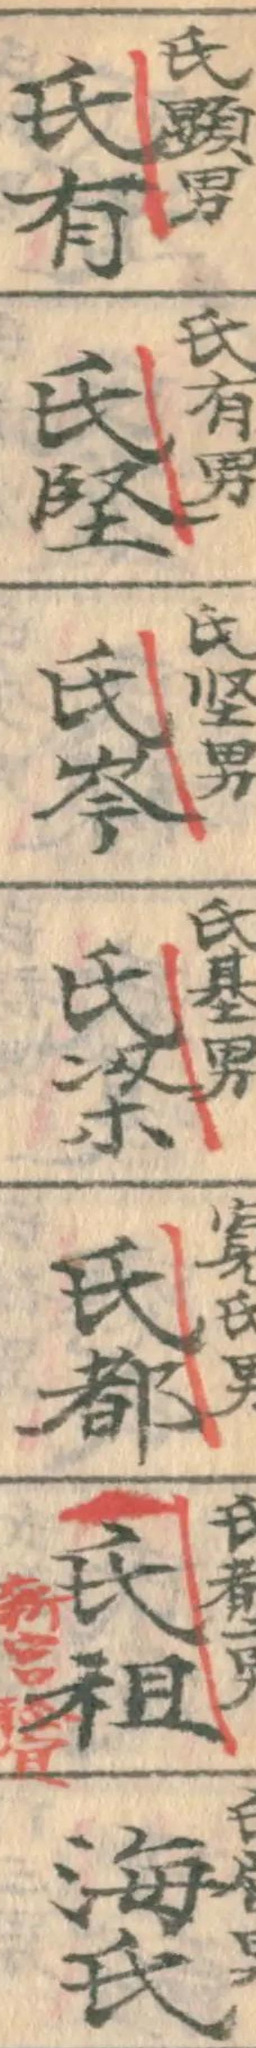氏有氏堅氏岑氏梁氏都▲氏祖海氏
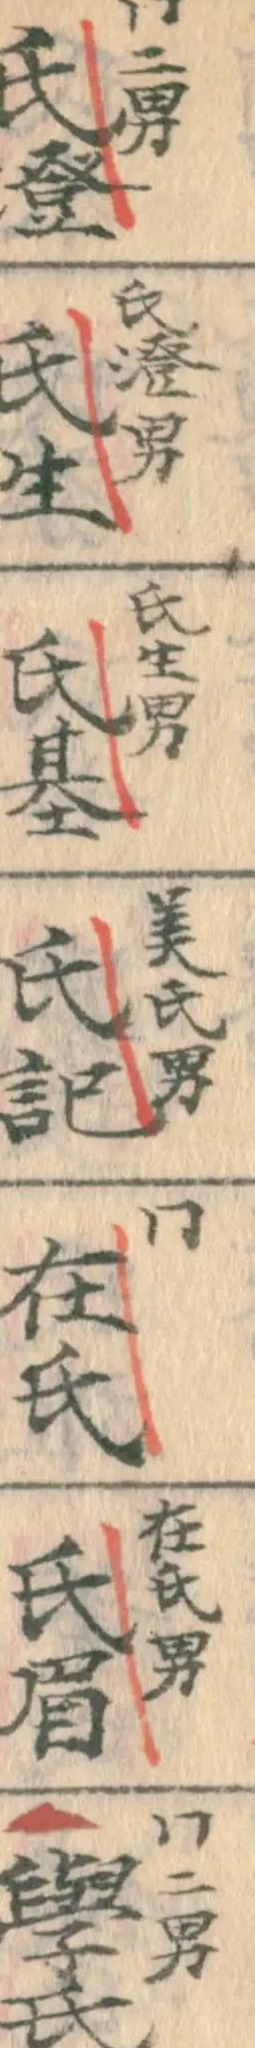氏澄氏生氏基氏記在氏氏眉▲学氏
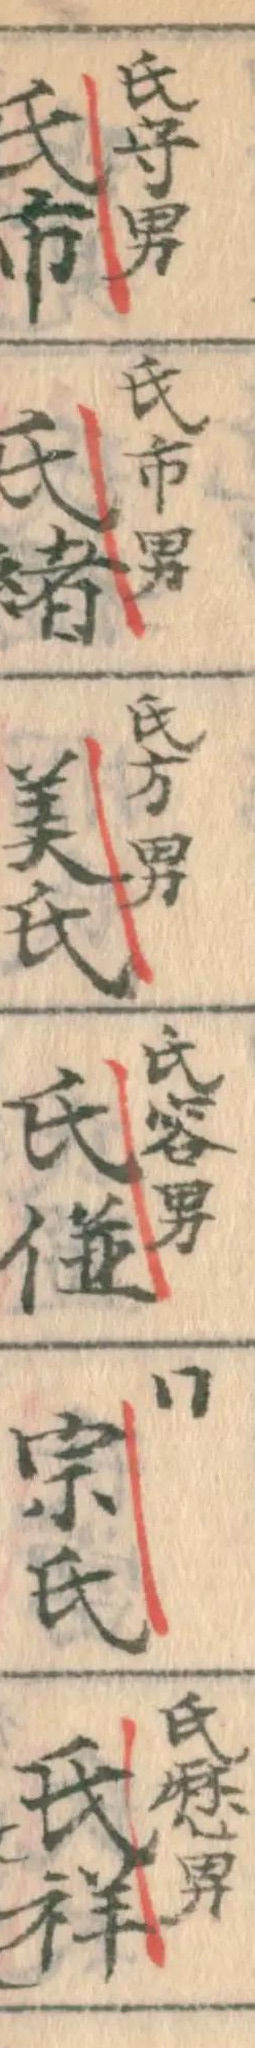氏市氏緒美氏氏宗氏氏祥
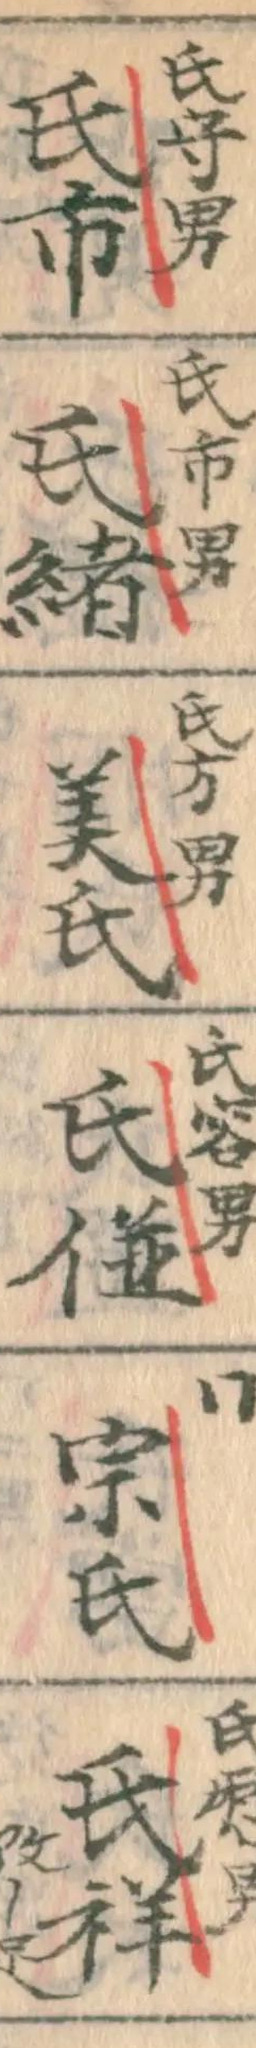氏市氏緒美氏氏宗氏氏祥
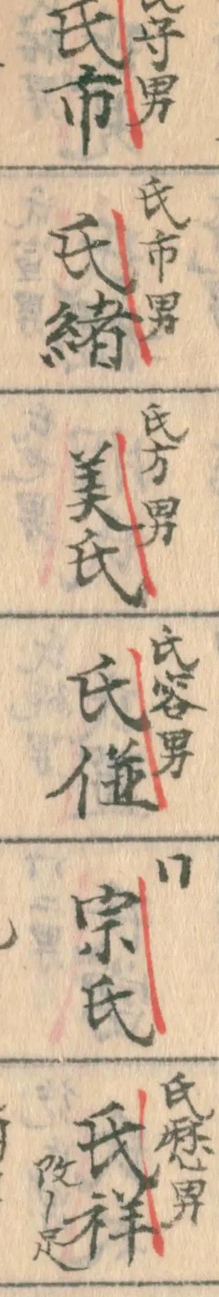氏市氏緒美氏氏宗氏氏祥
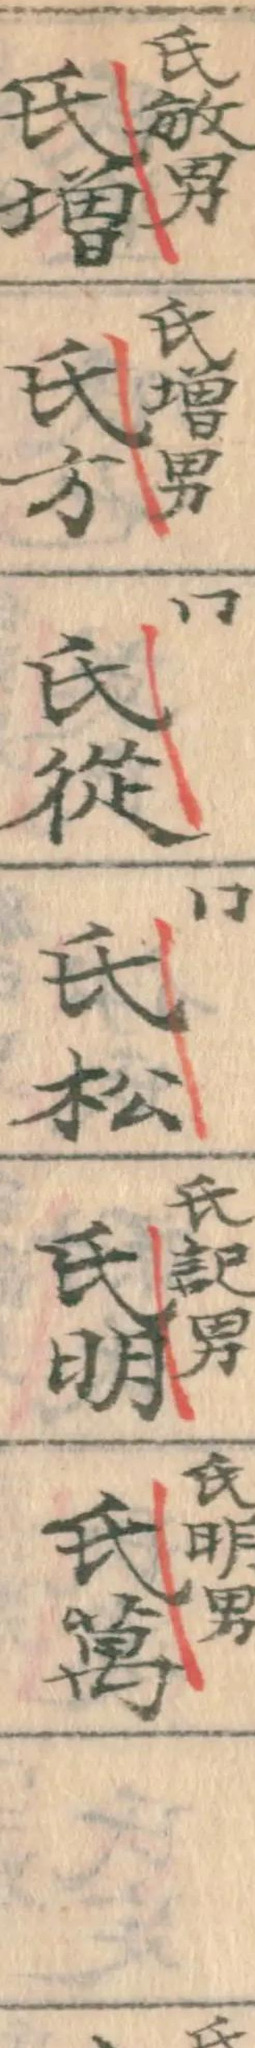氏増氏方氏従氏松氏明氏万氏良
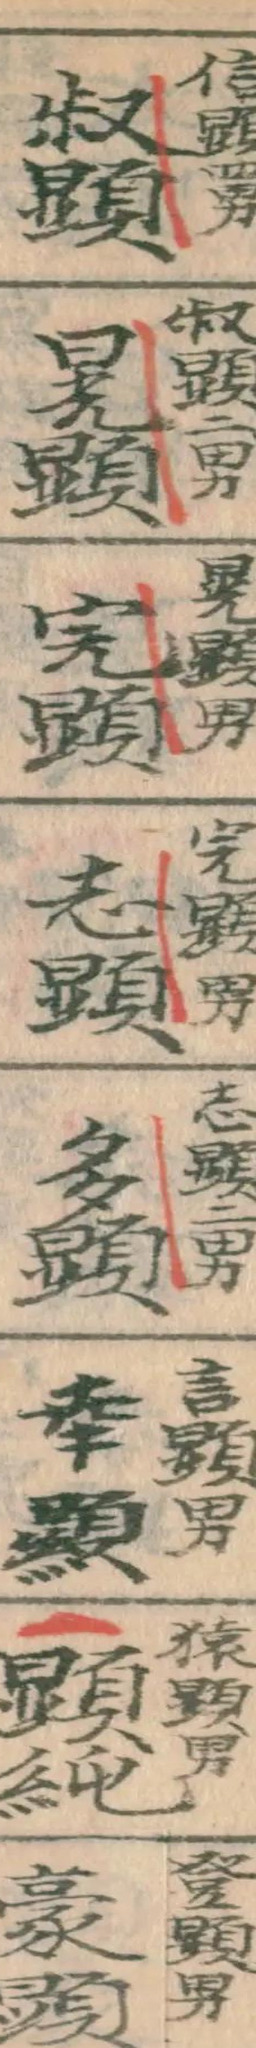叔顕晃顕完顕志顕多顕幸顕▲顕純豪顕
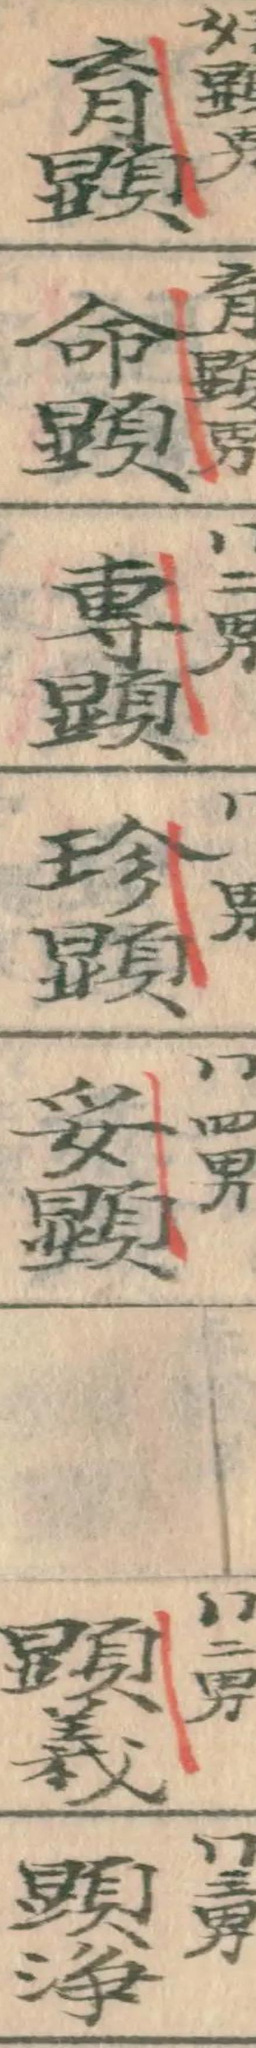育顕命顕専顕珍顕妥顕顕義顕浄
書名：賀茂社記録. 第24冊
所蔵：国立国会図書館 National Diet Library, JAPAN
